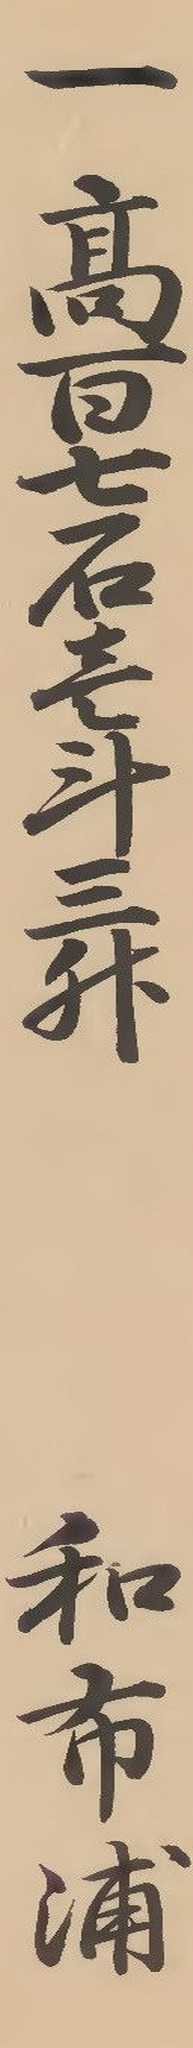一高百七石壱斗三升和布浦
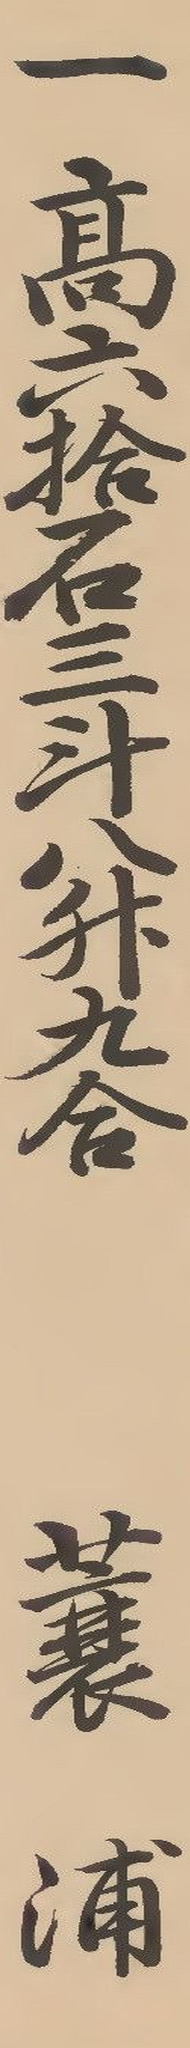一高六拾石三斗八升九合蓑浦
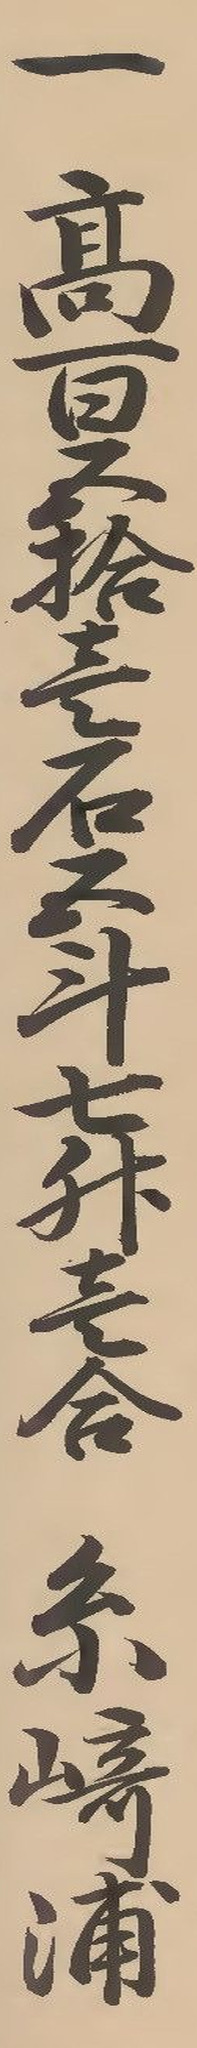一高百五拾壱石五斗七升壱合糸崎浦
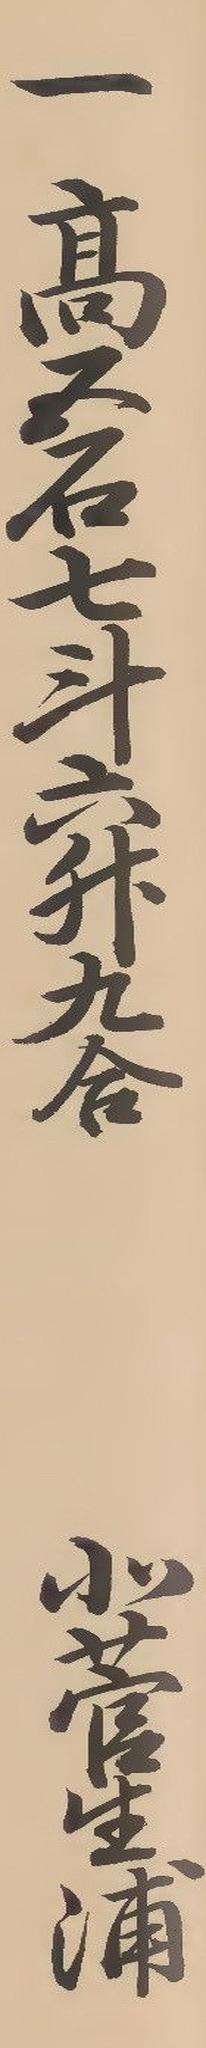一高五石七斗六升九合北菅生浦
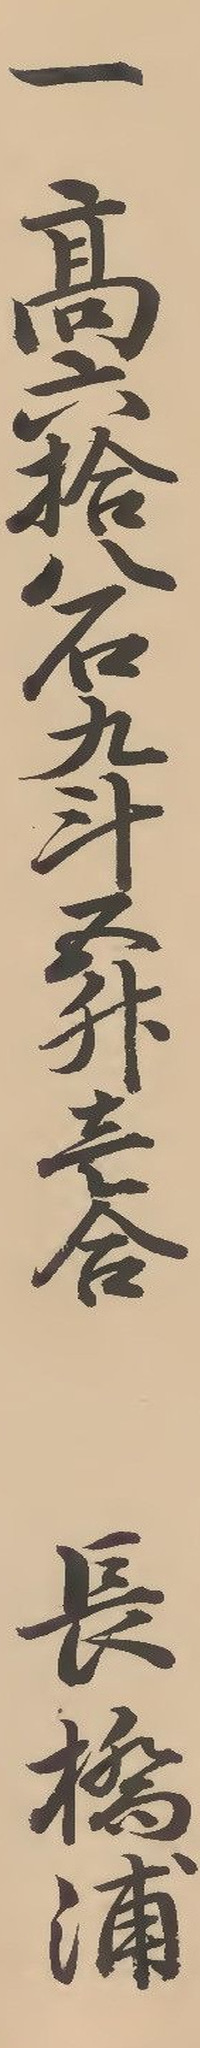一高六拾八石九斗五升壱合長橋浦
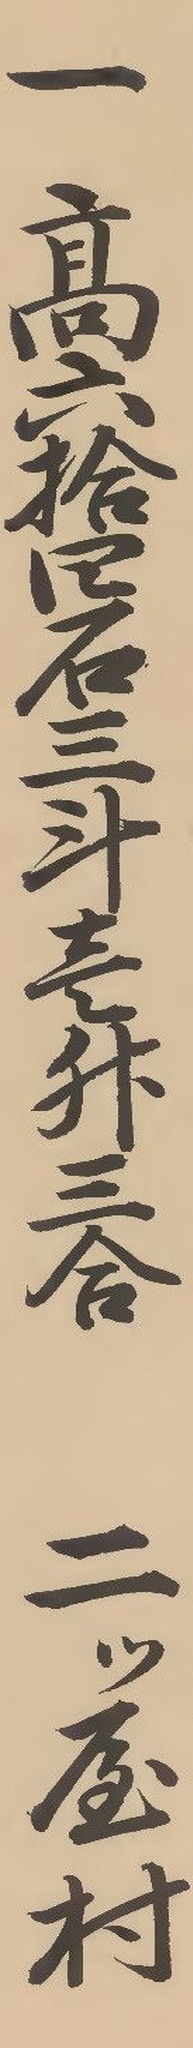一高六拾四石三斗壱升三合二ツ屋村
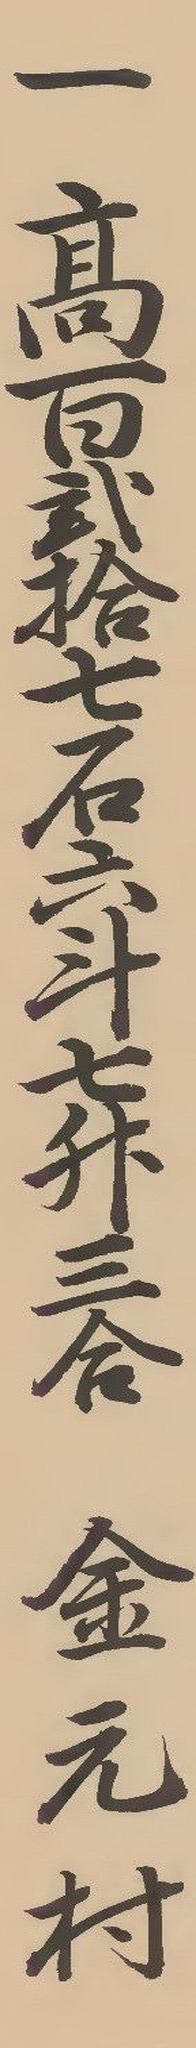一高百弐拾七石六斗七升三合金元村

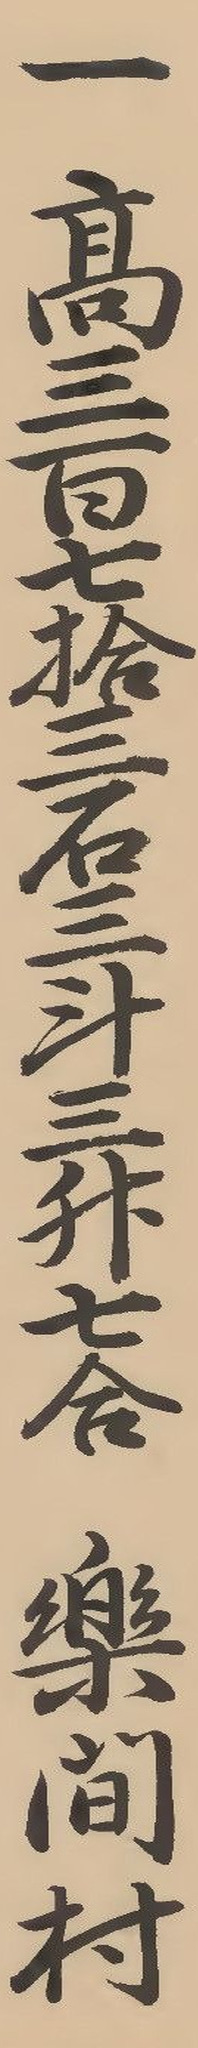一高三百七拾三石三斗三升七合楽間村
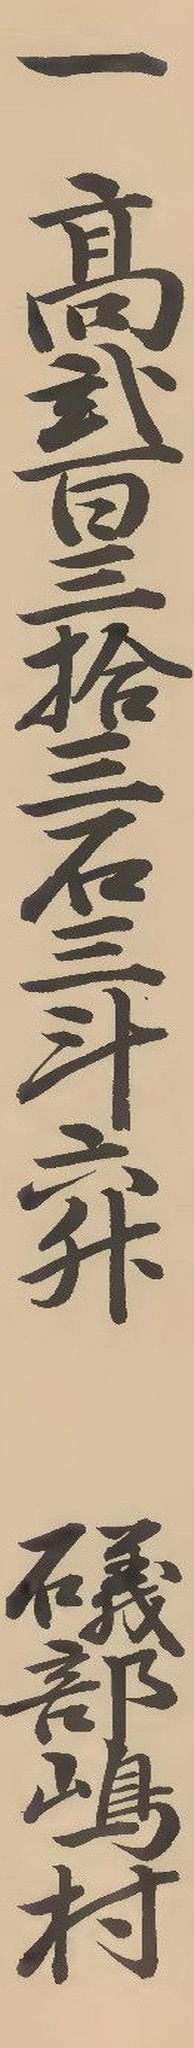一高弐百三拾三石三斗六升磯部島村
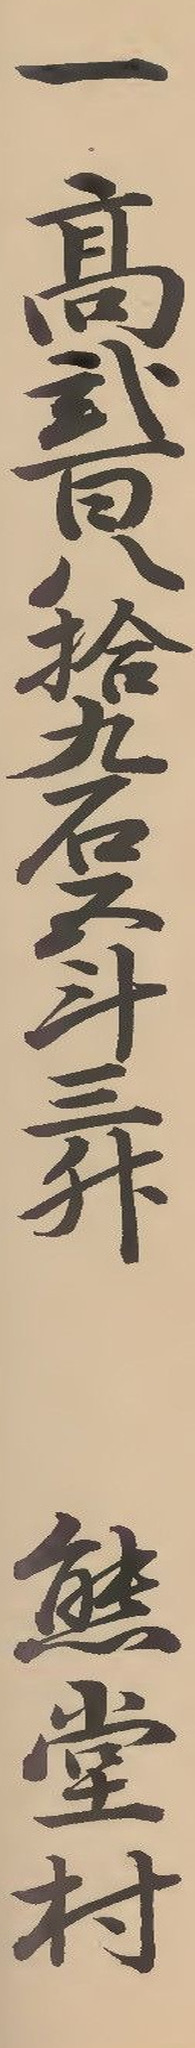一高弐百八拾九石五斗三升熊堂村
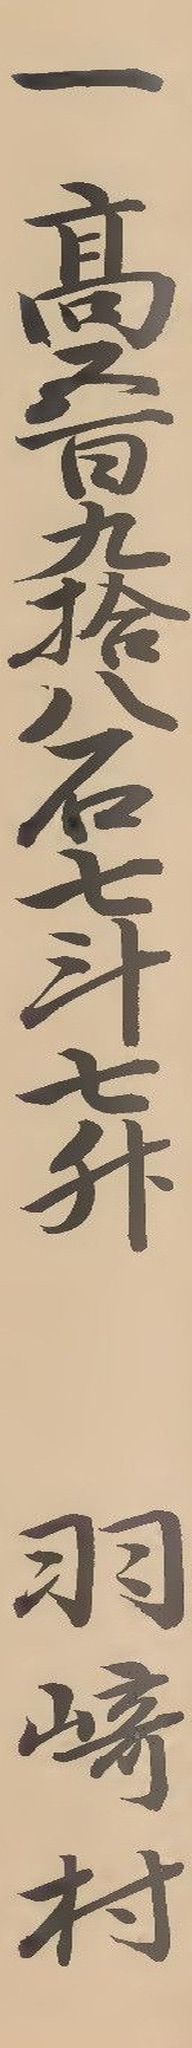一高五百九拾八石七斗七升羽崎村
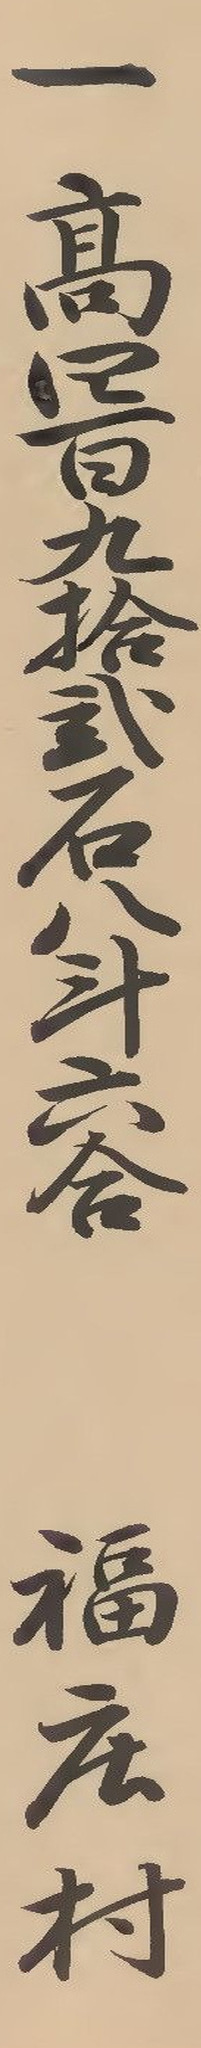一高四百九拾弐石八斗六合福庄村
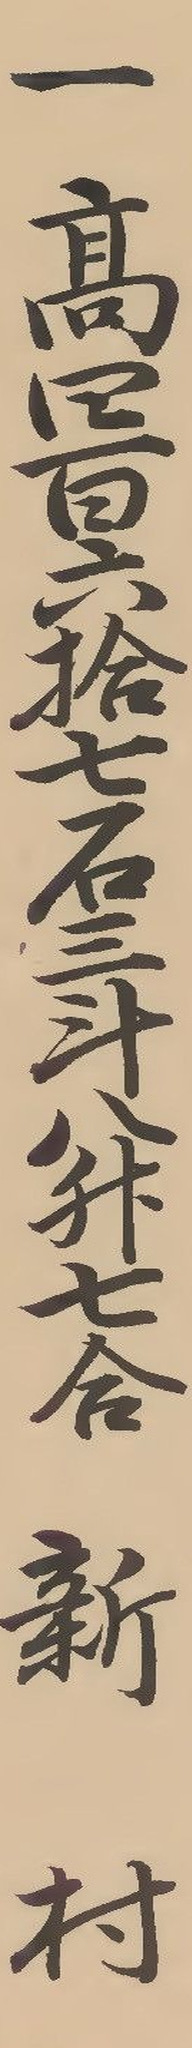一高四百六拾七石三斗八升七合新村

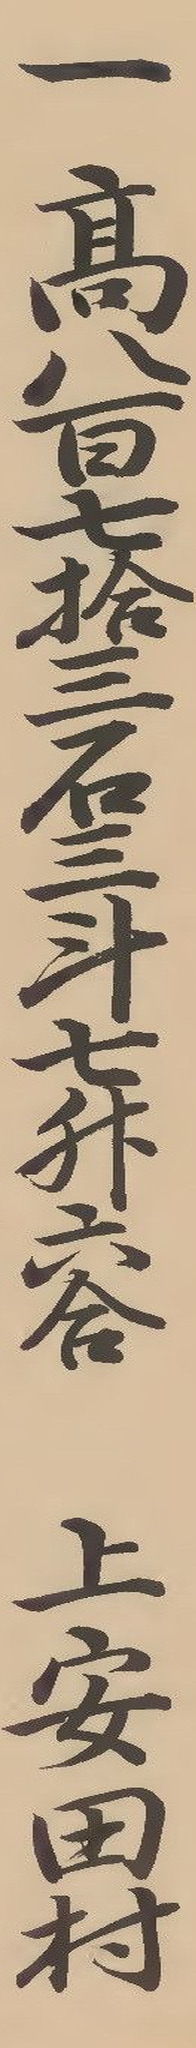一高八百七拾三石三斗七升六合上安田村
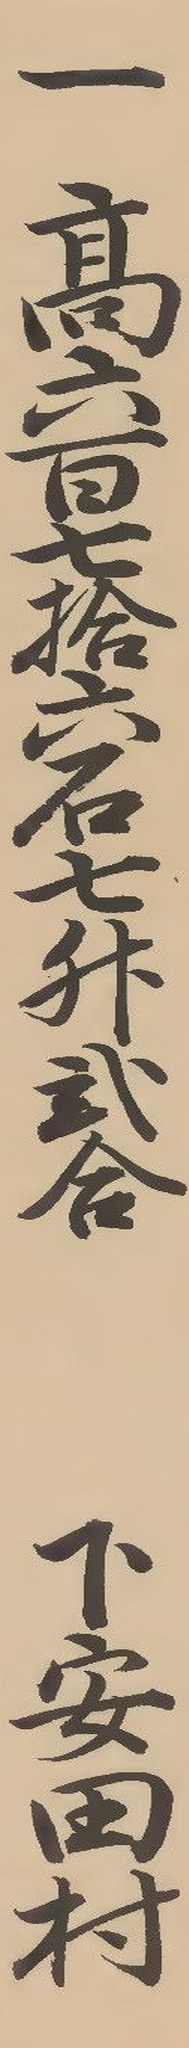一高六百七拾六石七升弐合下安田村
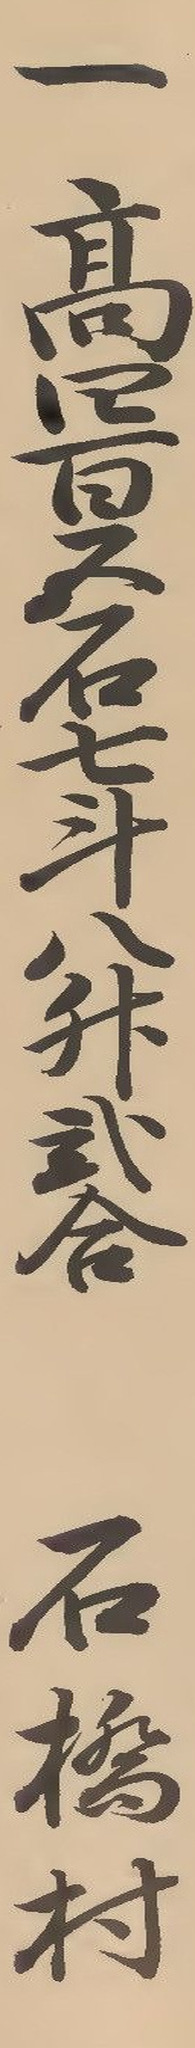一高四百五石七斗八升弐合石橋村
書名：越前国郷帳
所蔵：国立公文書館 National Archives of Japan
